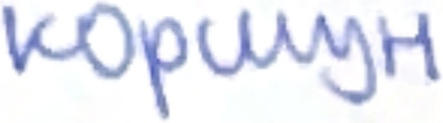коршун
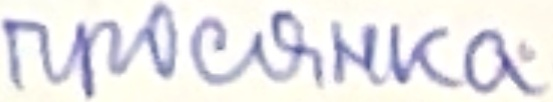просянка
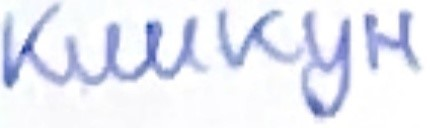кликун
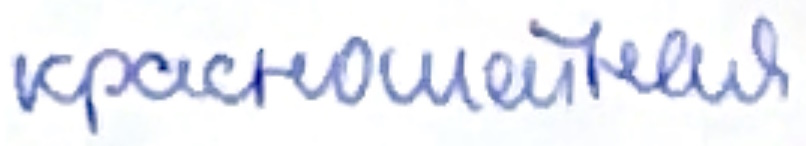красношейная
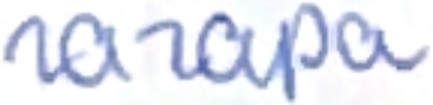гагара
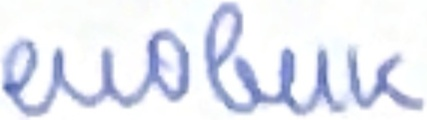еловик
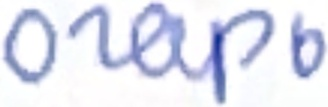огарь
